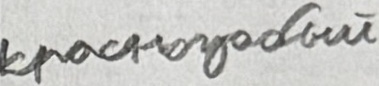краснозобый
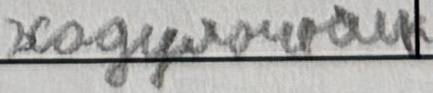ходулочник
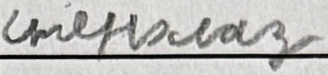стенолаз
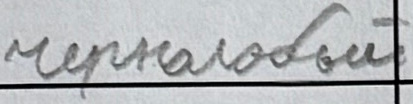чернолобый
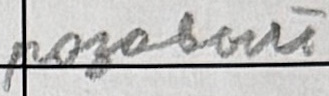розовый
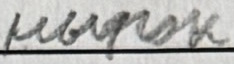нырок
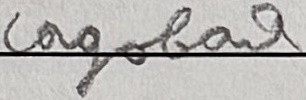садовая
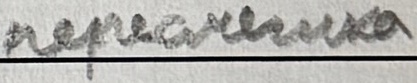пересмешка
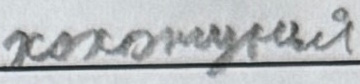хохотунья
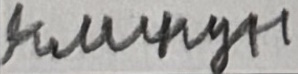кликун
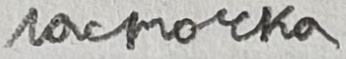ласточка
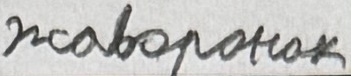жаворонок
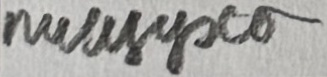пищуха
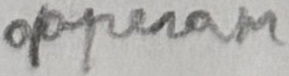фрегат
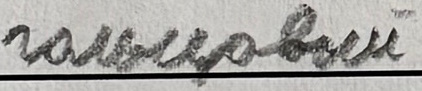гольцовый
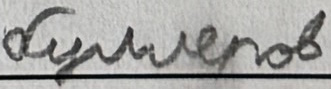буллеров
